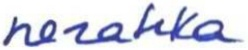пеганка
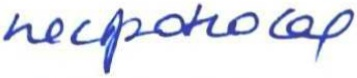пестроносая
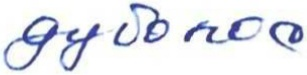дубонос
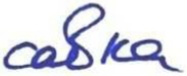савка
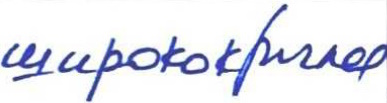ширококрылая
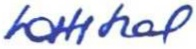южная
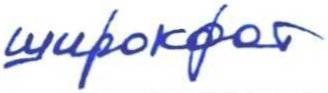широкрот
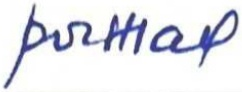рыжая
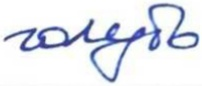голубь
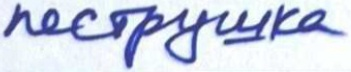пеструшка
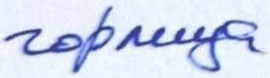горлица
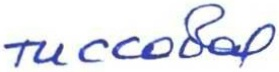тиссовая
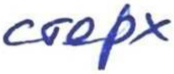стерх
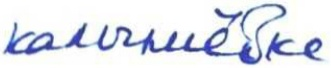камышёвка
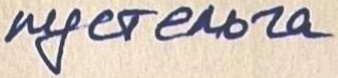пустельга
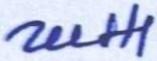чиж
